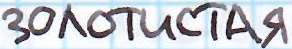золотистая
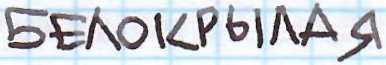белокрылая
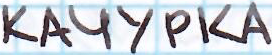качурка
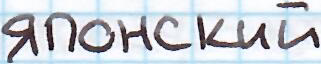японский
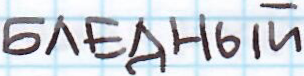бледный
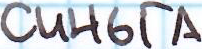синьга
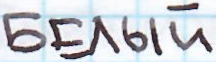белый
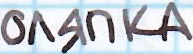оляпка
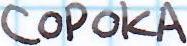сорока
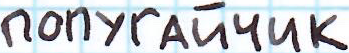попугайчик
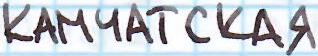камчатская
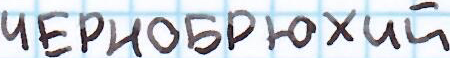чернобрюхий
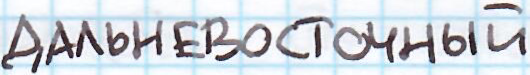дальневосточный
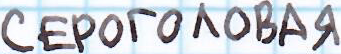сероголовая
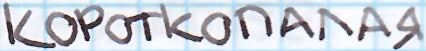короткопалая
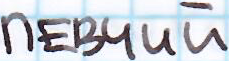певчий
